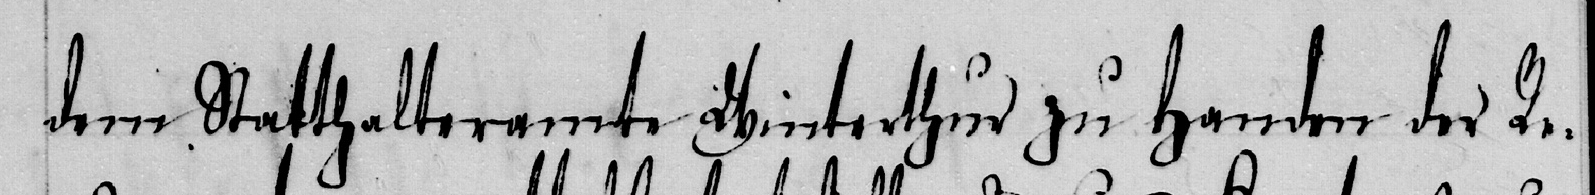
dem Statthalteramte Winterthur zu Handen der Re¬
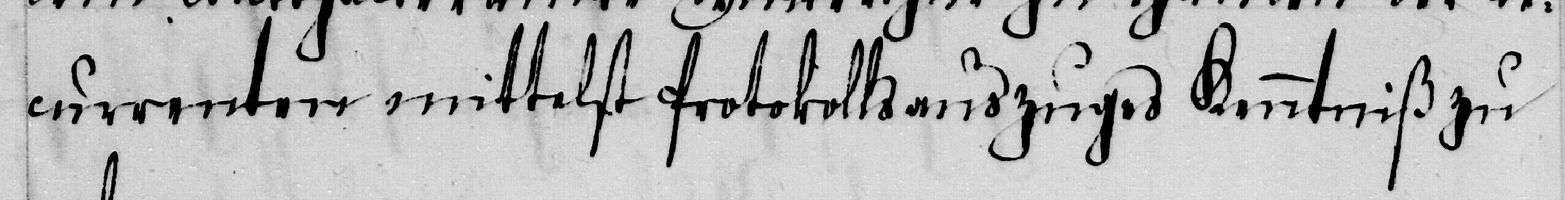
currenten mittelst Protokollsauszuges Kenntniß zu
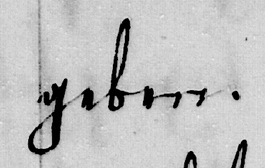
geben.
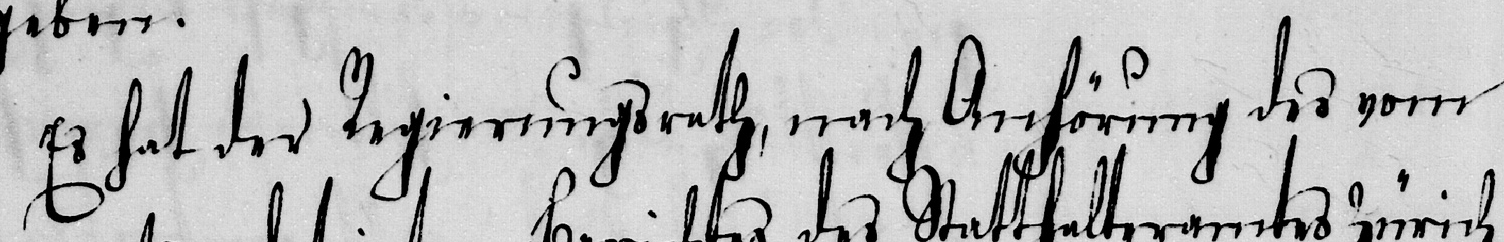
Es hat der Regierungsrath, nach Anhörung des vom
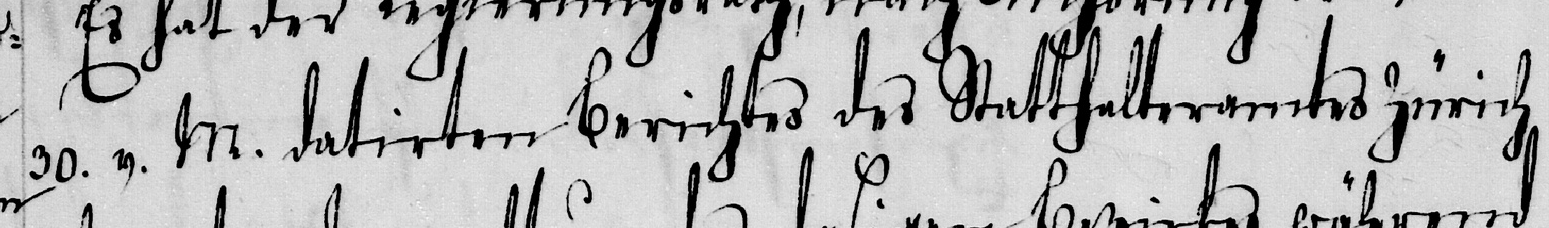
30. v. M. datirten Berichts des Statthalteramtes Zürich
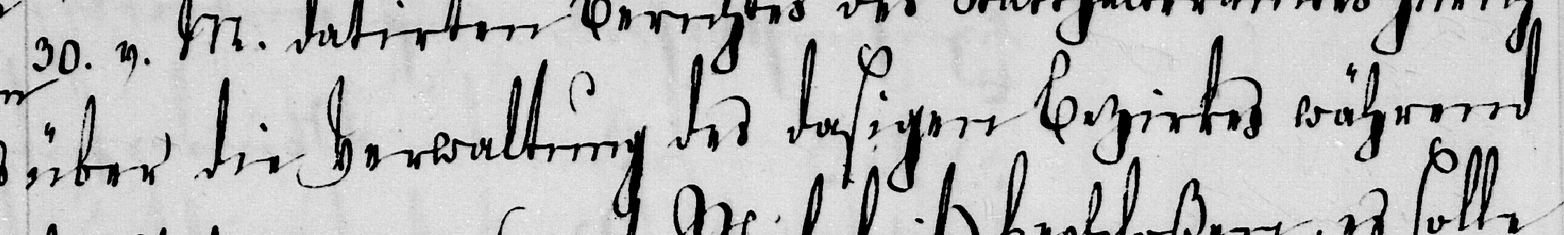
über die Verwaltung des dasigen Bezirks während
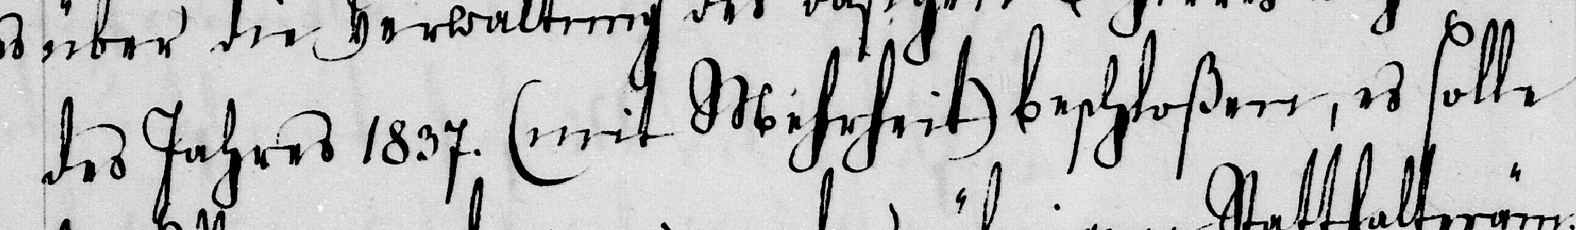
des Jahres 1837. (mit Mehrheit) beschloßen, es solle
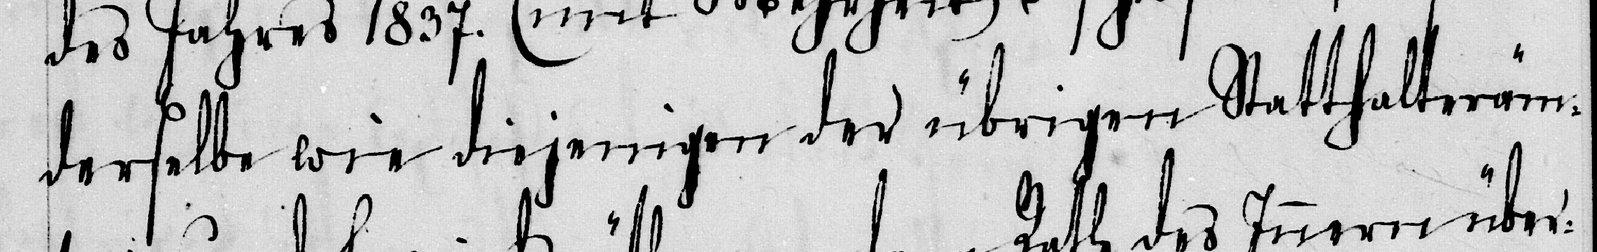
derselbe wie diejenigen der übrigen Statthalteräm¬
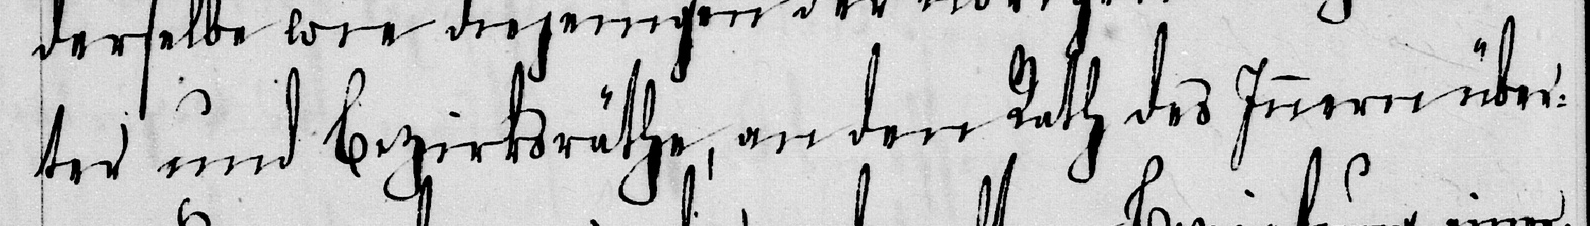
ter und Bezirksräthe, an den Rath des Innern über¬
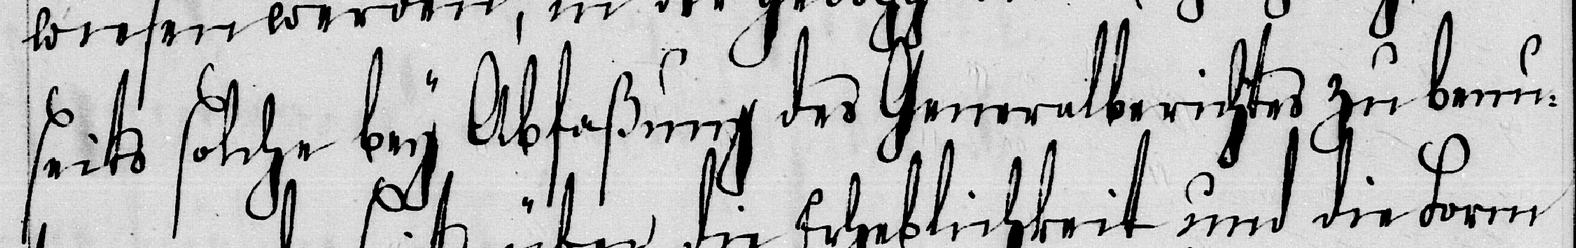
eits solche bey Abfaßung des Generalberichtes zu ben¬
